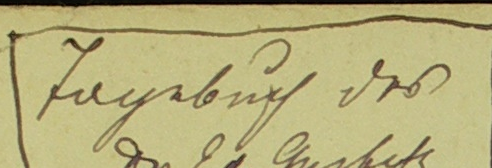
Tagebuch des
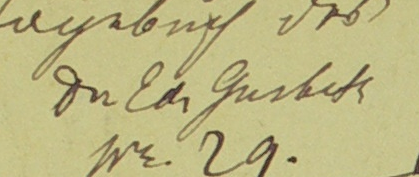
Dr. Ed. Gusbeth
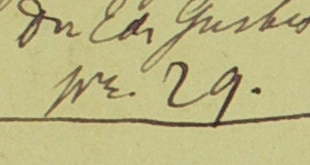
Nr. 29
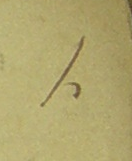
2
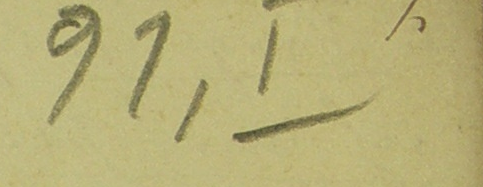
91, I
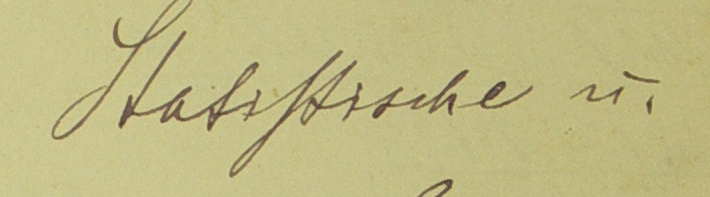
Statistische und
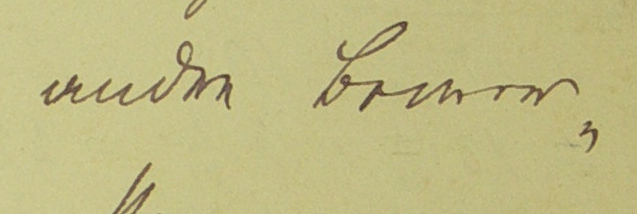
andere Bemer¬
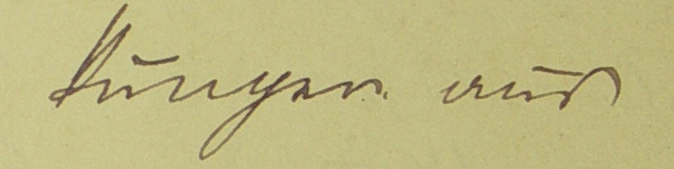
kungen aus
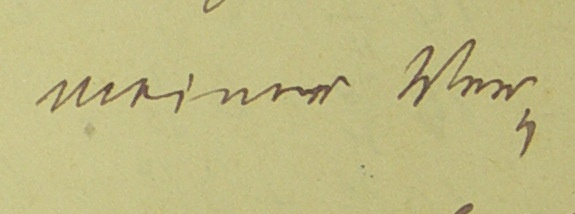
meiner Ver¬
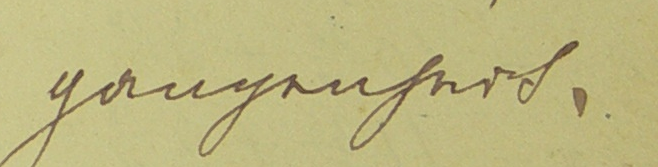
gangenheit.
